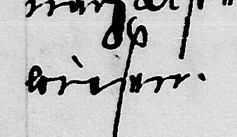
den.
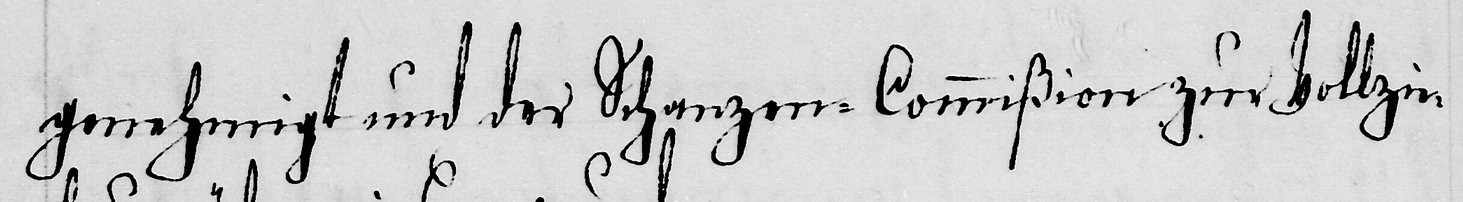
genehmigt und der Schanzen-Commißion zur Vollzie¬
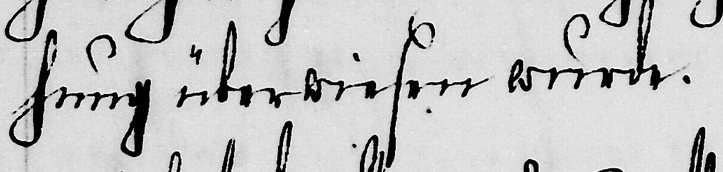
hung überwiesen wurde.
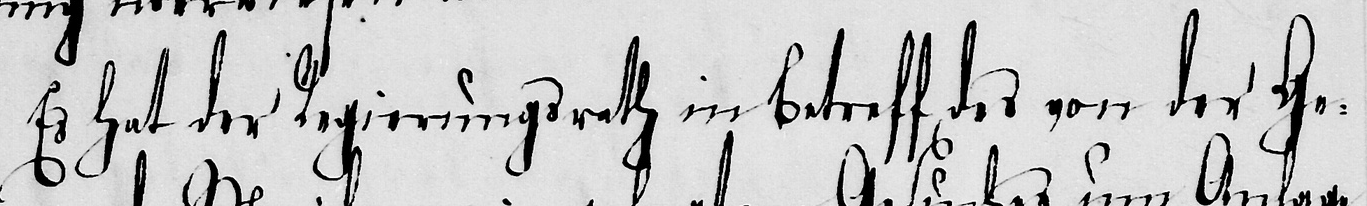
Es hat der Regierungsrath in Betreff des von der Ge¬
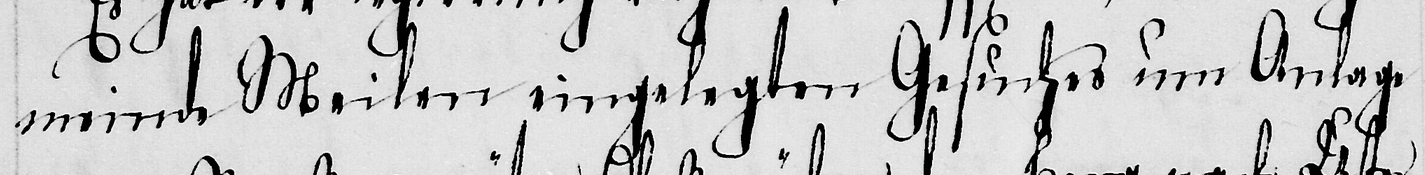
meinde Meilen eingelegten Gesuches um Anlage
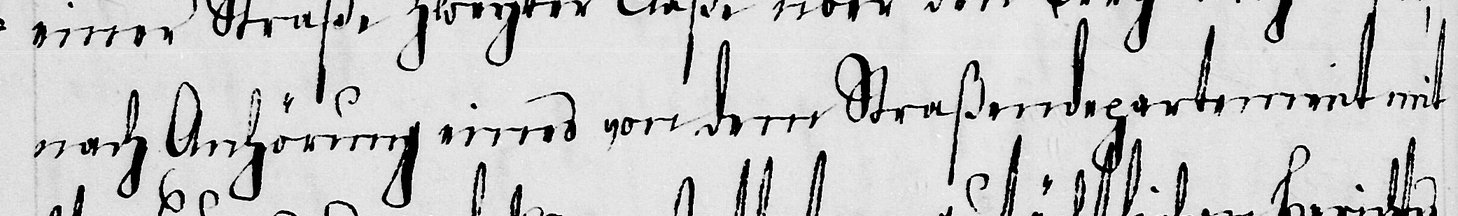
nach Anhörung eines von dem Straßendepartement mit
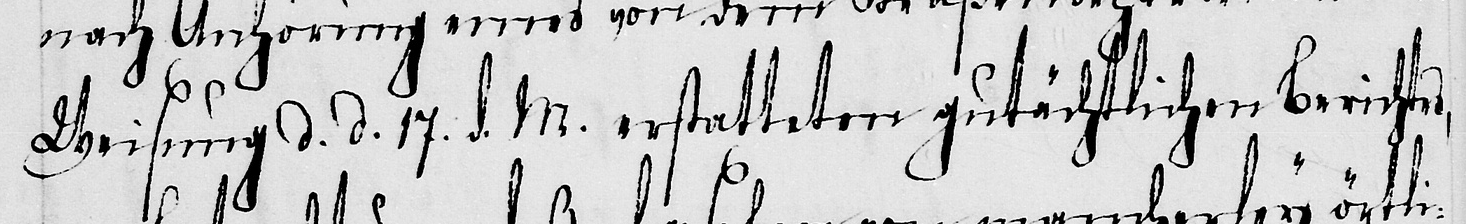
Weisung d. d. 17. d. M. erstatteten gutächtlichen Bericht¬
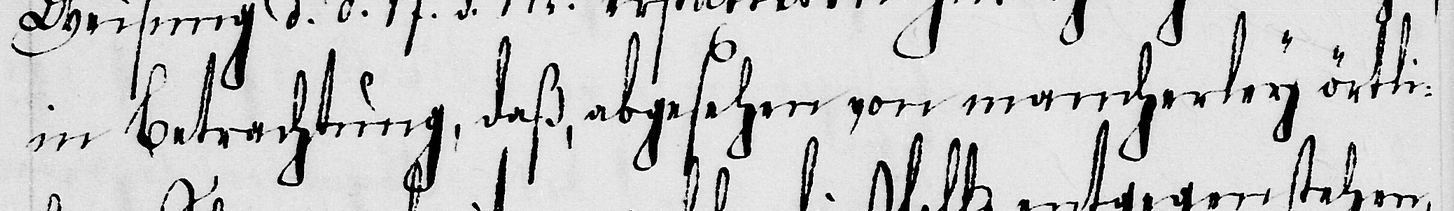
in Betrachtung, daß, abgesehen von mancherley ört¬
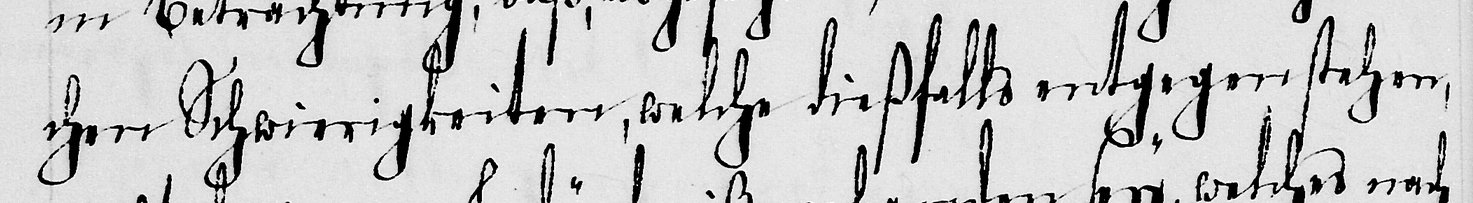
hchen Schwierigkeiten, welche dießfalls engegen stehen,
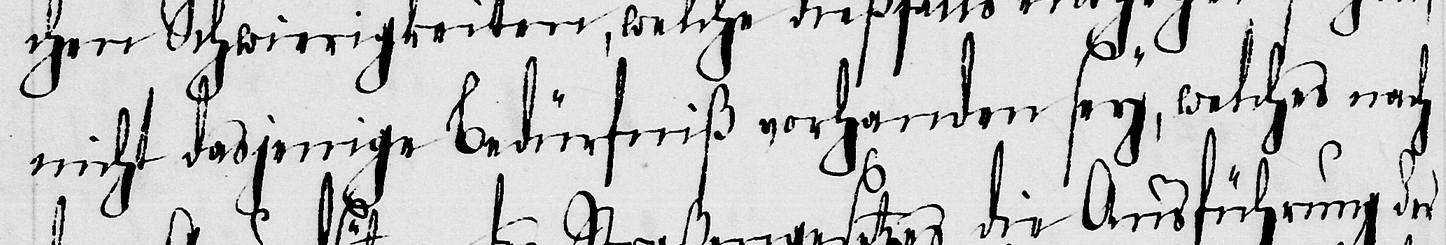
nicht dasjenige Bedürfniß vorhanden sey, welches nach
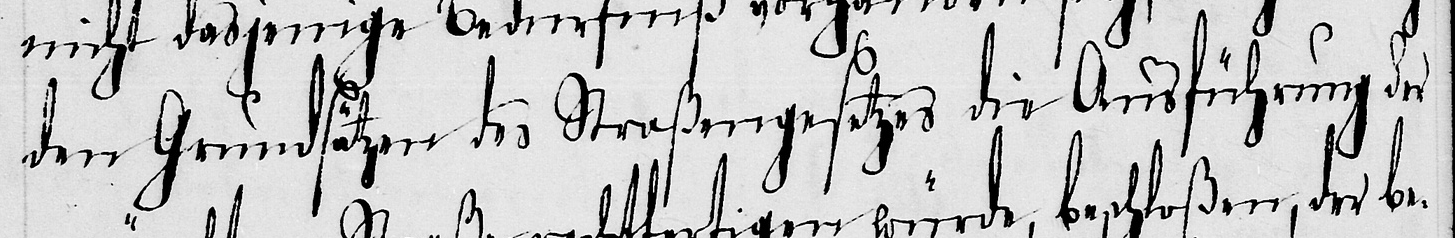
den Grundsätzen des Straßengesetzes die Ausführung der
